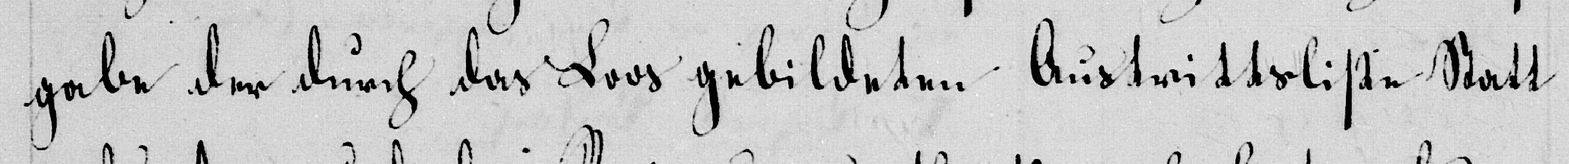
gabe der durch das Loos gebildeten Austrittsliste Statt
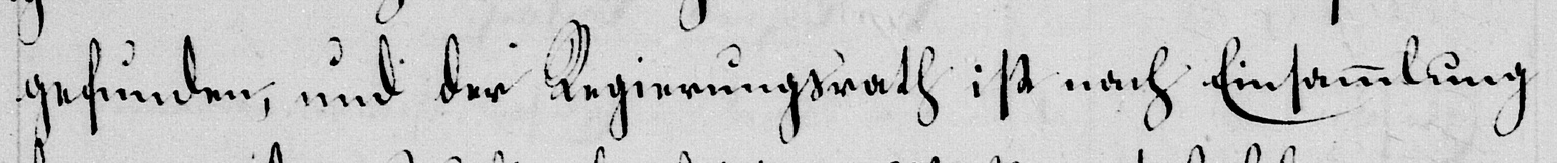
gefunden, und der Regierungsrath ist nach Einsammlung
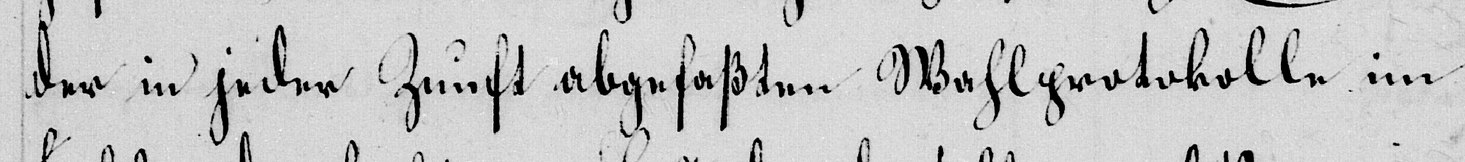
der in jeder Zunft abgefassten Wahlprotokolle im
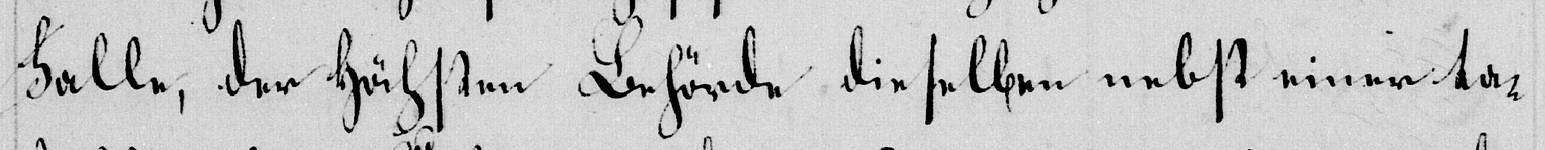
Falle, der Höchsten Behörde dieselbe nebst einer ta¬
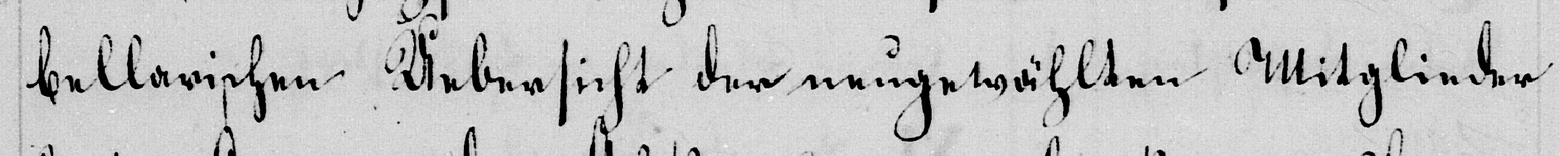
bellarischen Uebersicht der neugewählten Mitglieder
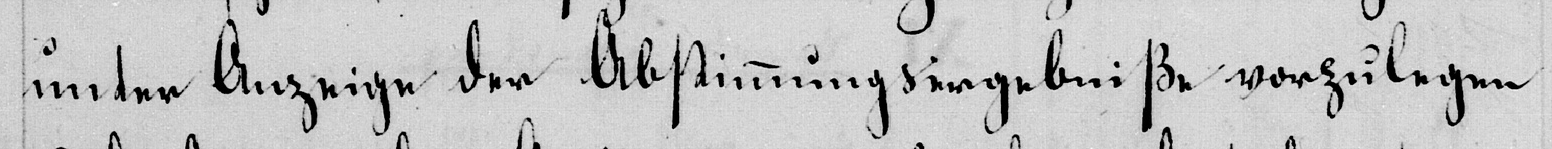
unter Anzeige der Abstimmungsergebnisse vorzulegen
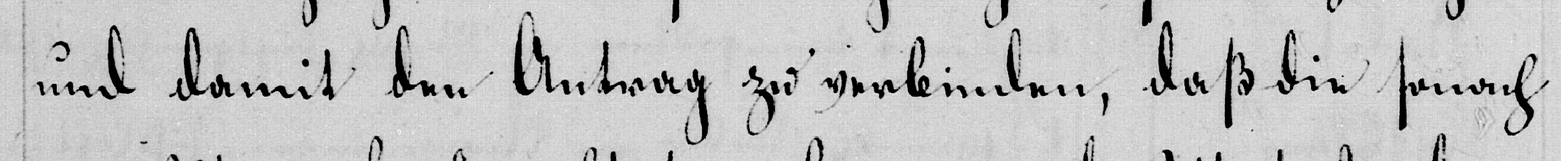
und damit den Antrag zu verbinden, dass die sonach
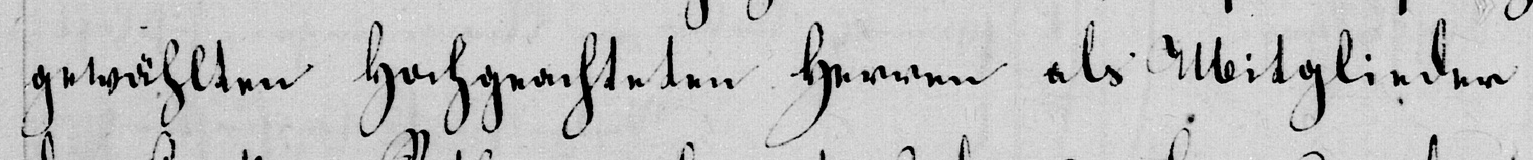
gewählten Hochgeachteten Herren als Mitglieder
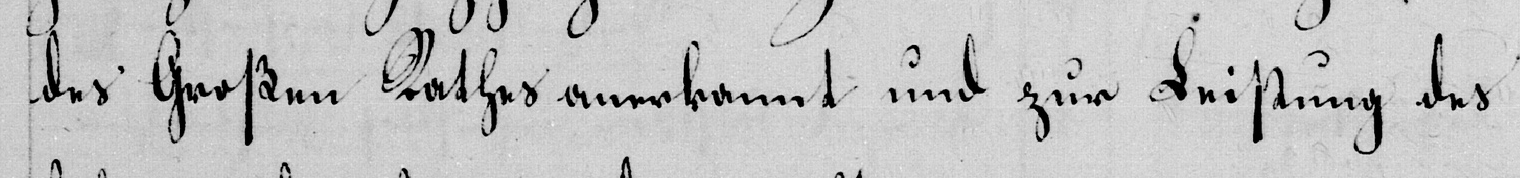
des Großen Rathes anerkannt und zur Leistung des
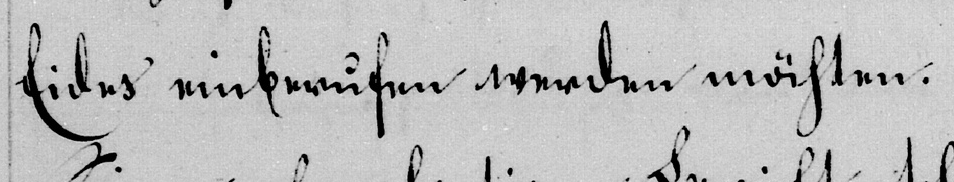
Eides einberufen werden möchten.
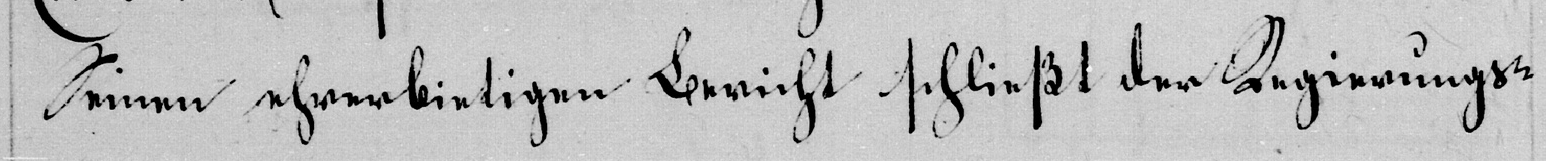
Seinen ehrerbietigen Bericht schließt der Regierungs-
